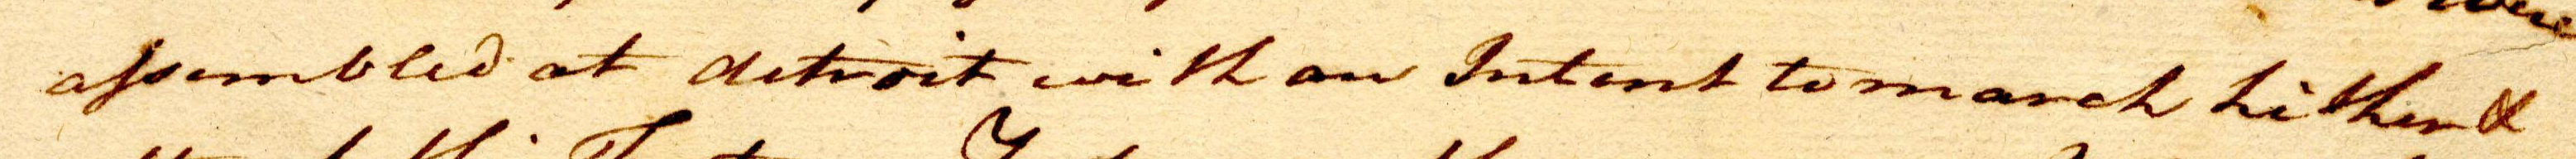assembled at detroit with an Intent to march hither &
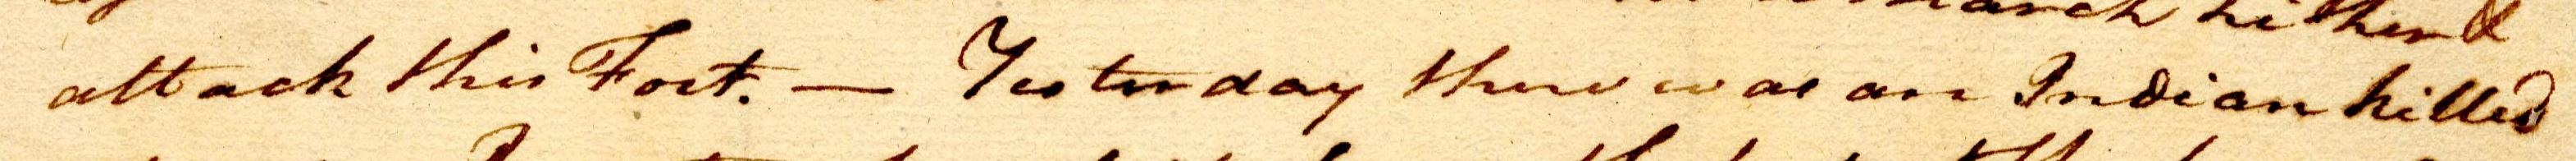attack this Fort.- Yesterday there was an Indian killed
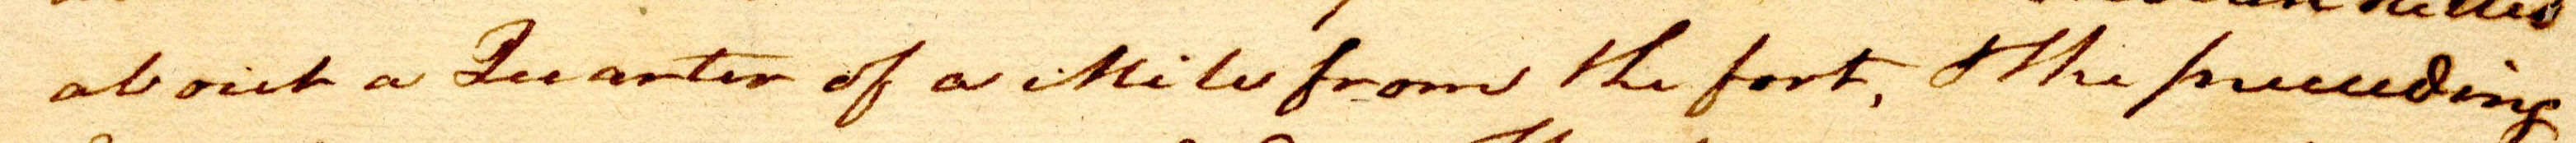about a Quarter of a Mile from the fort, & the preceding
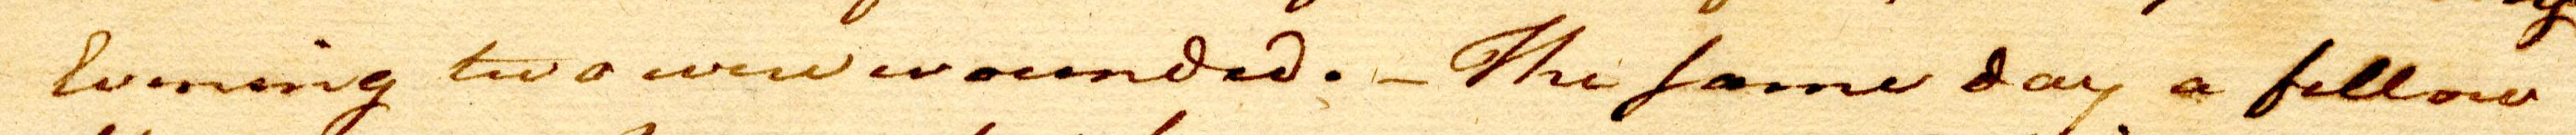Evening two were wounded.- The same day a fellow
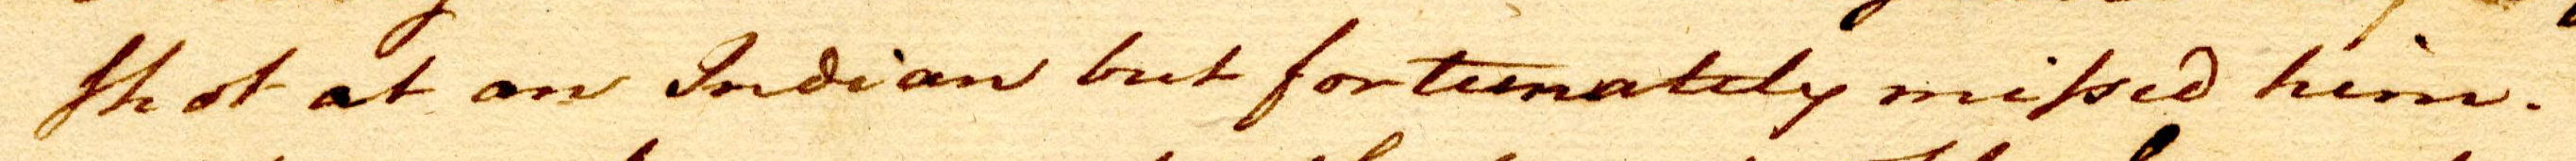shot at an Indian but fortunately missed him.
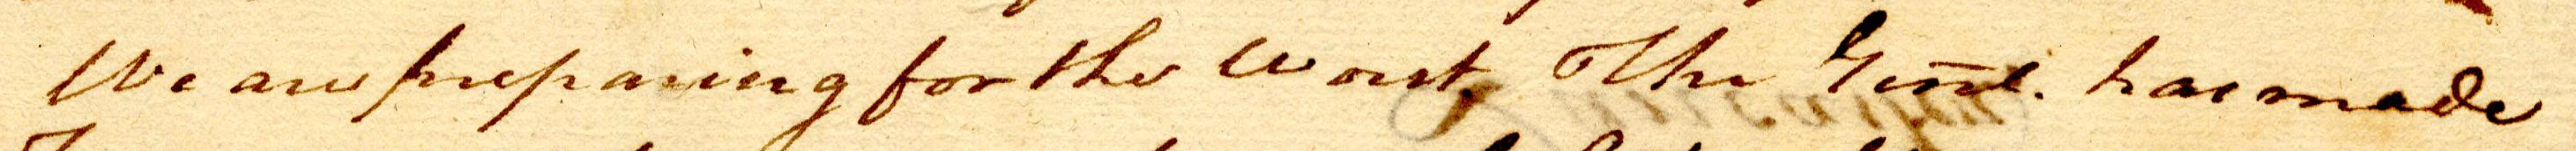We are preparing for the Worst. The Gen̄l has made
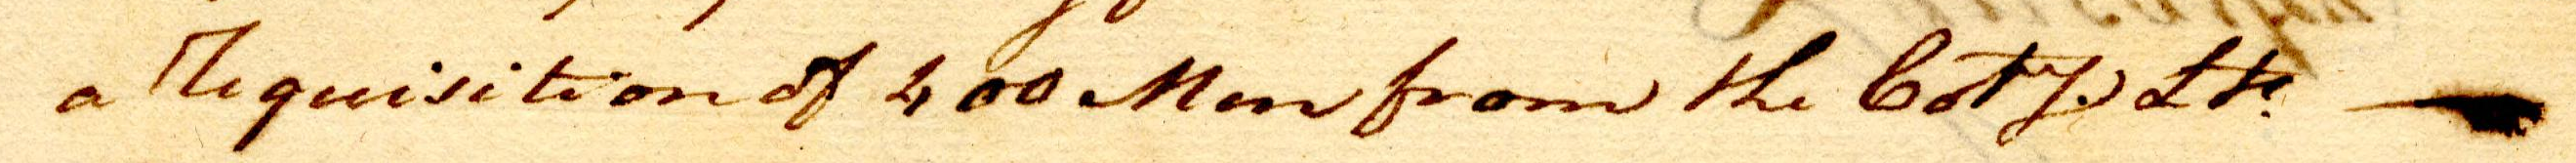a Requisition of 400 Men from the Capt: Lt^t.-
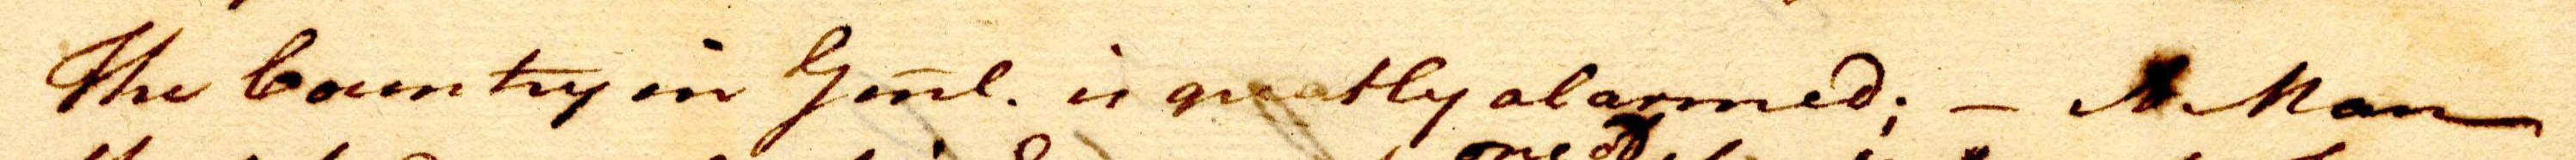The Country in Gen̄l is greatly alarmed;- A Man
